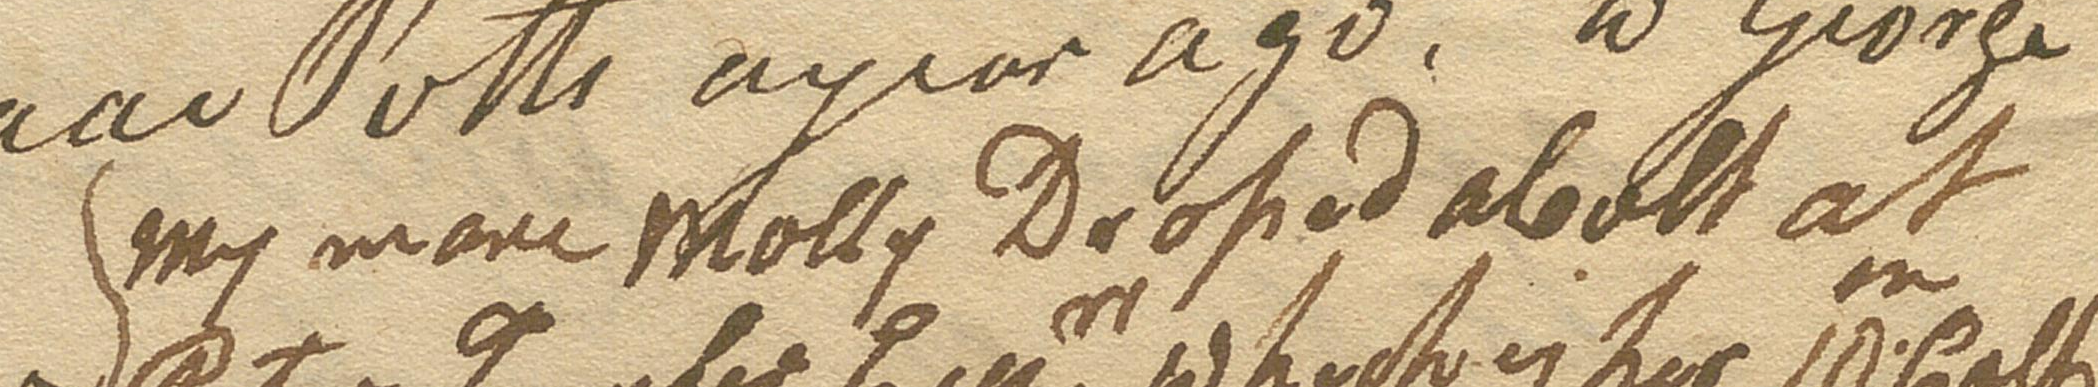my mare Molly Droped a Colt at
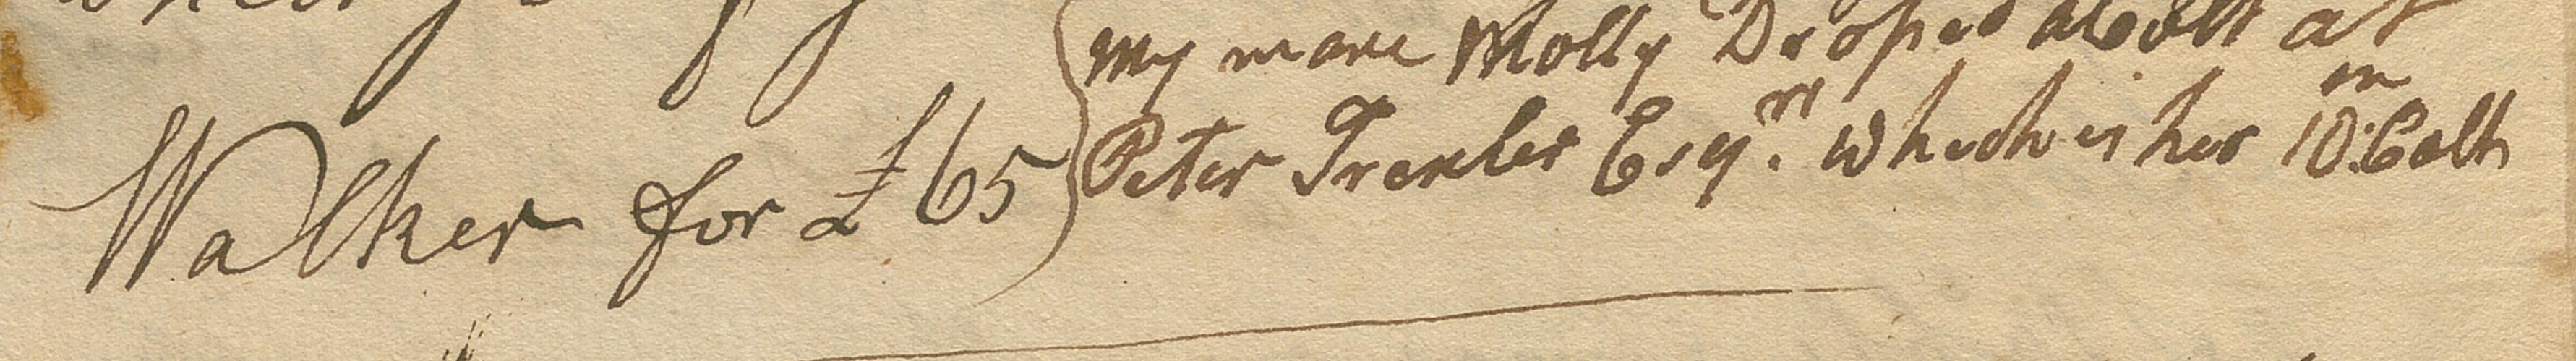Walker for £65 Peter Trenler Esq^r. which is her 10^th Colt
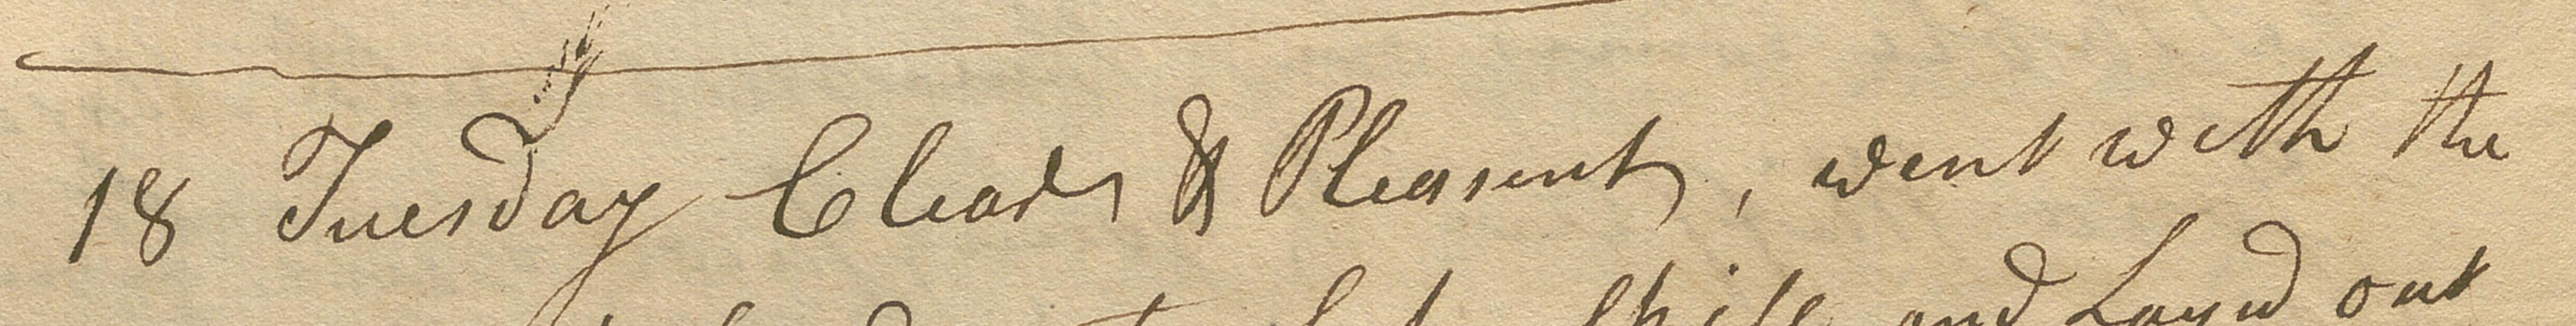18 Tuesday Clear & Pleasent, went with the
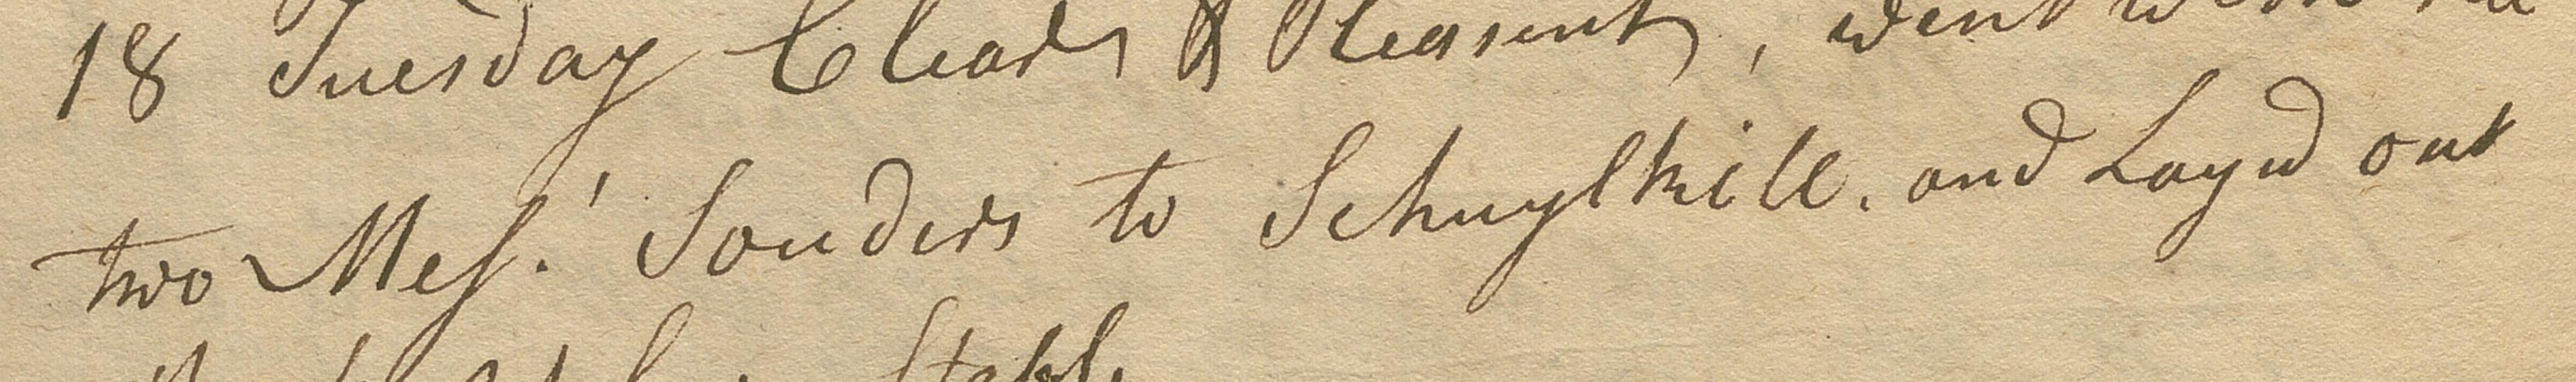two Mes^r. Souders to Schuylkill and Layed out
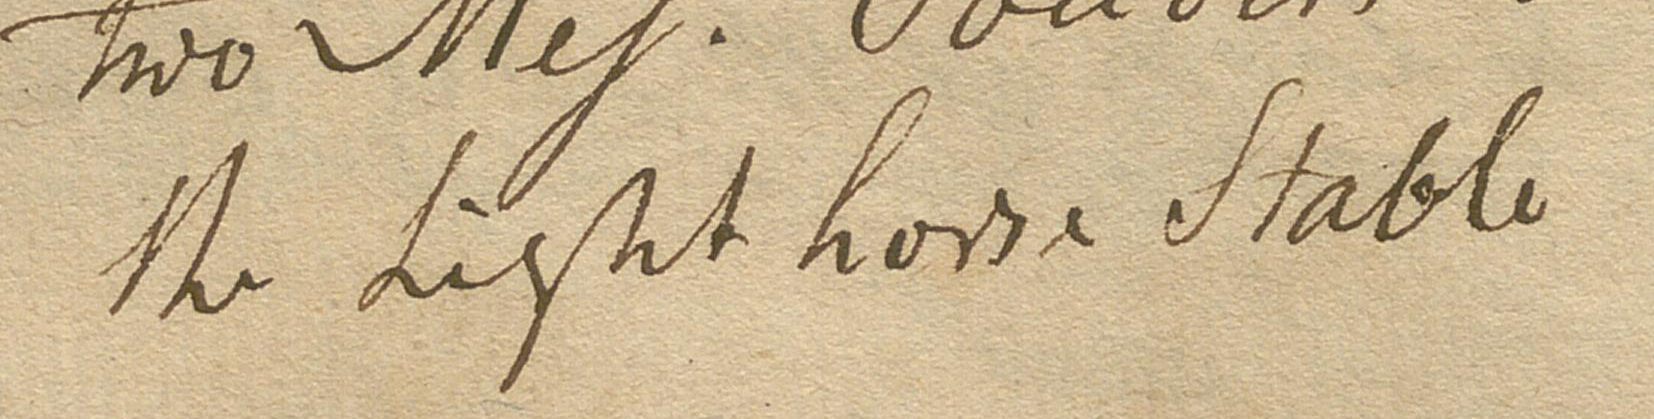the Light horse Stable
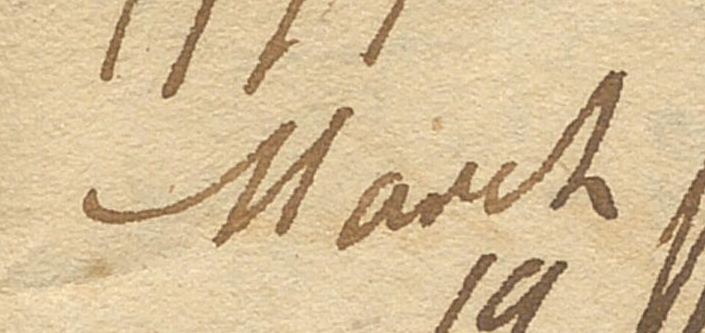March
